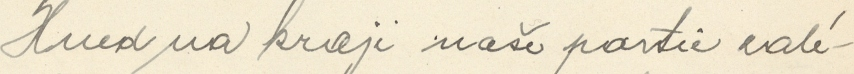Hned na kraji naše partie zalé-
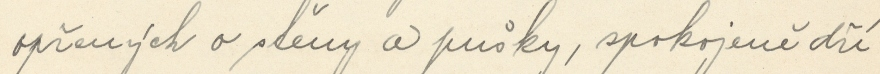opřených o stěny a pušky, spokojeně dří-
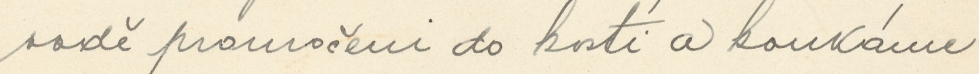vodě promočeni do kosti a koukáme
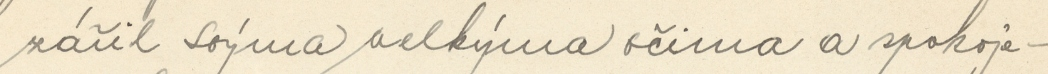zářil svýma velkýma očima a spokoje-
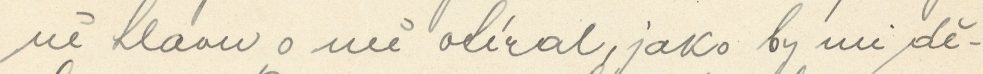ně hlavu o mě otíral, jako by mi dě-
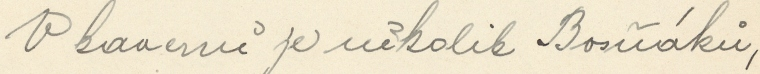V kaverně je několik Bosňáků,
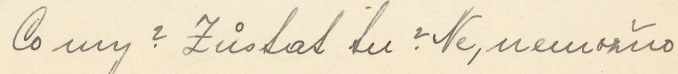Co my? Zůstat tu? Ne, nemožno.
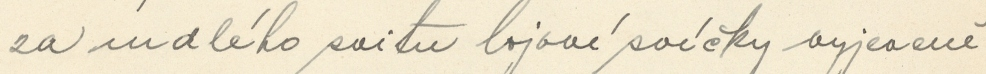za mdlého svitu lojové svíčky vyjeveně
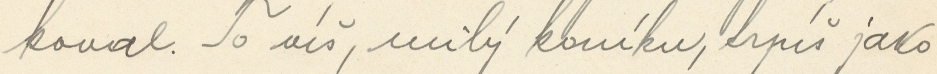koval. To víš, milý koníku, trpíš jako
